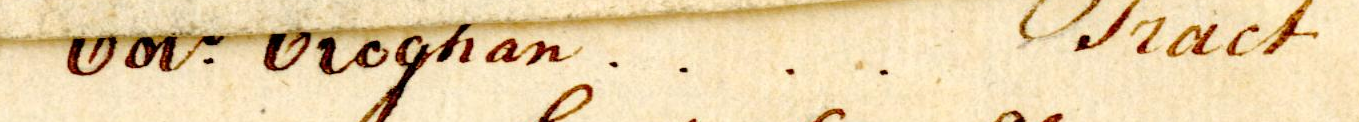Ge^o Croghan. . . Tract
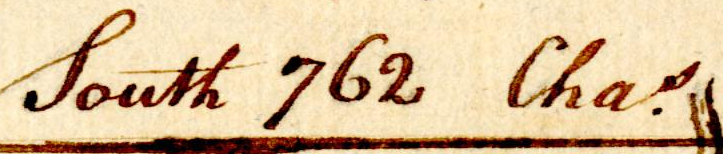South 762 Cha^s.
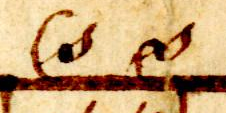(s a)
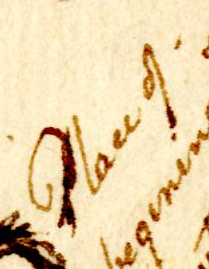Place of
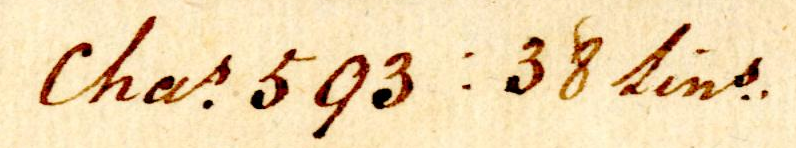Cha^r. 593 : 38 Lin^s
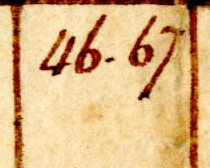46.67
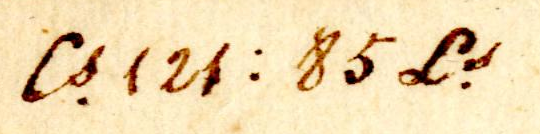C^s. 121: 85 £^s
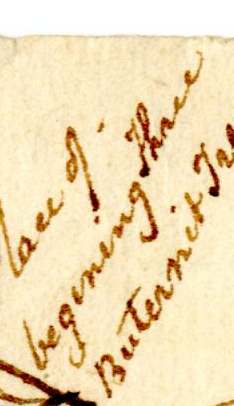begening Three
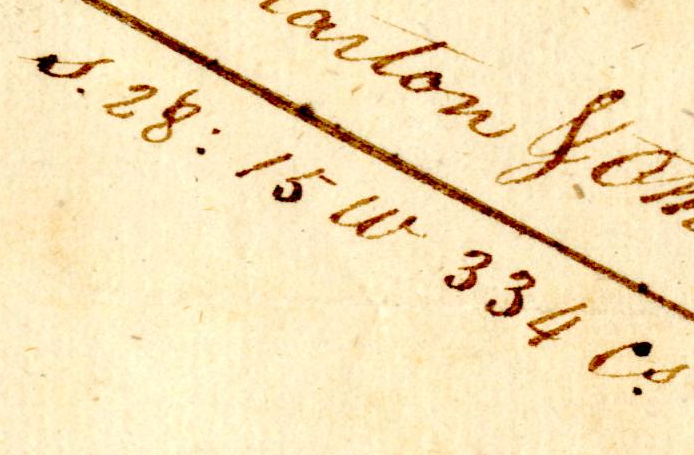S. 28 : 15 W 334 C^s.
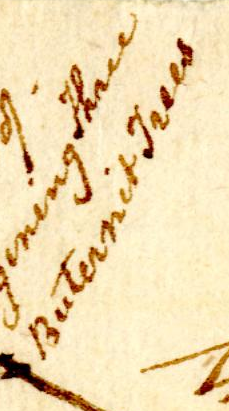Buternit Trees
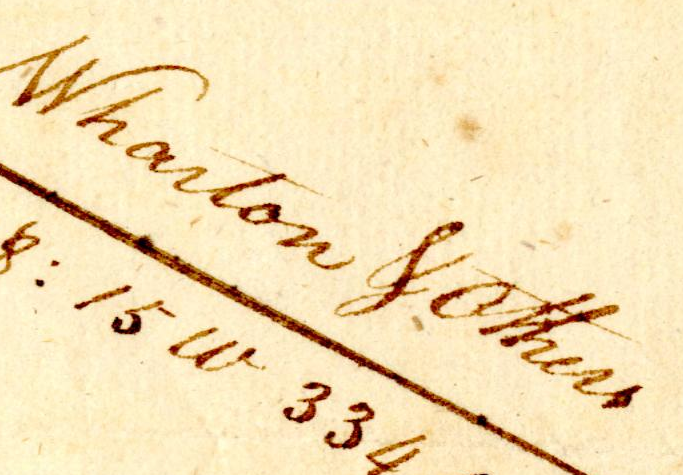Wharton & Others
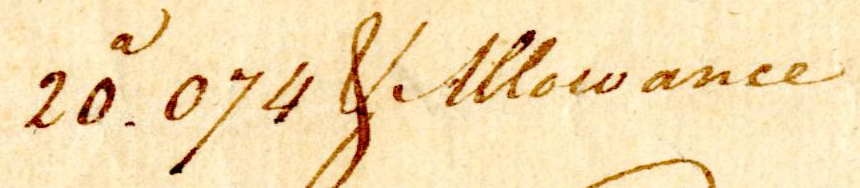20. 074 & Allowance
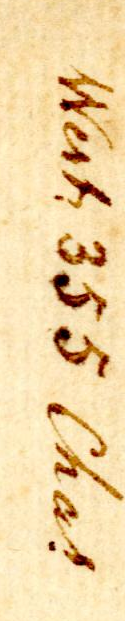West 355 Cha^s.
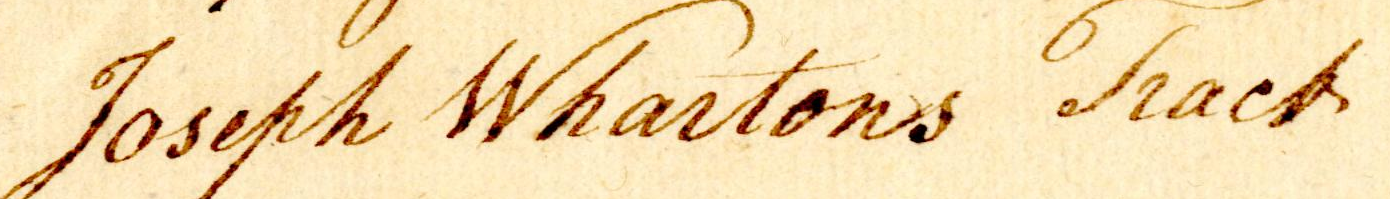Joseph Whartons Tract
